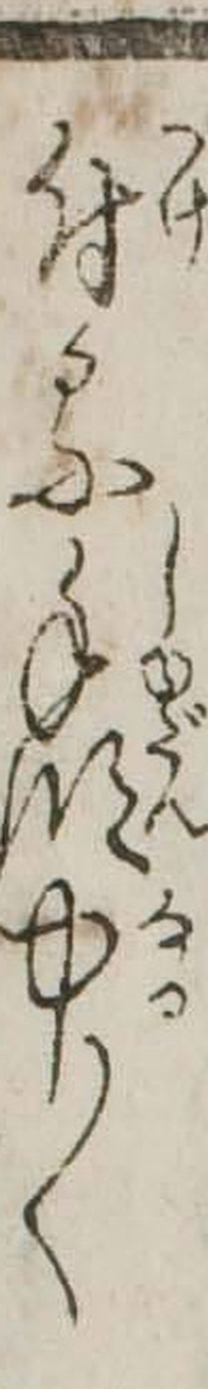付る手段中〳〵
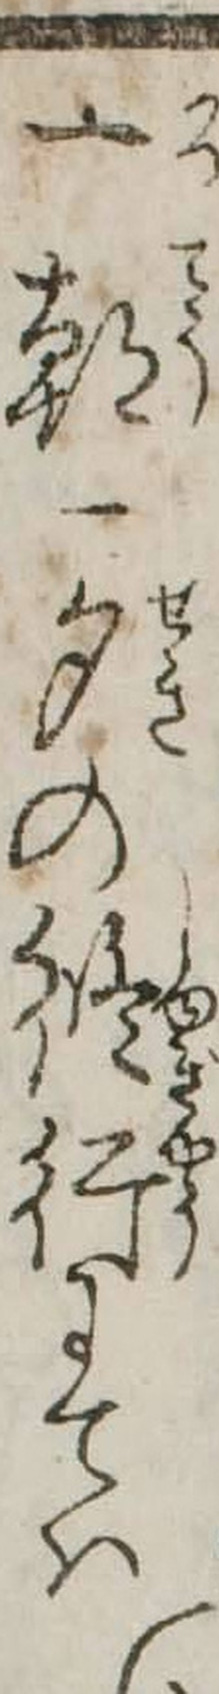一朝一夕の修行にては
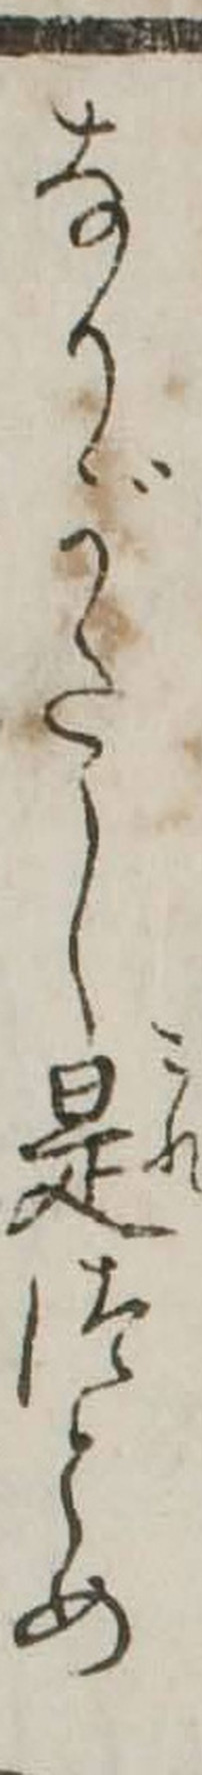なりがたし是つとめ
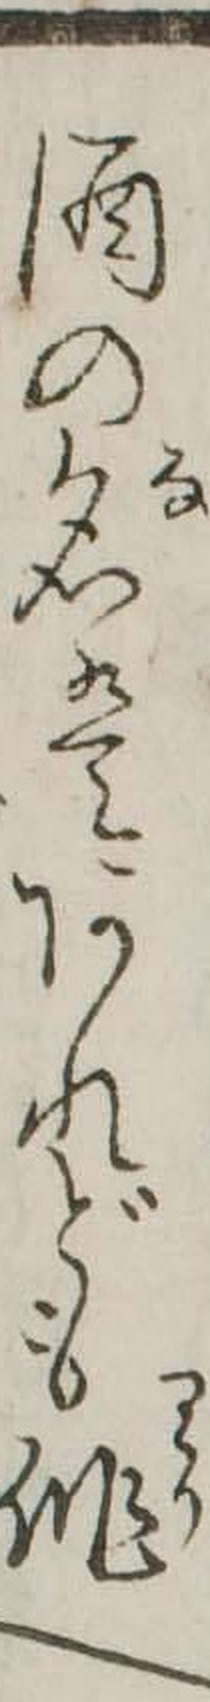酒の名はあれども作
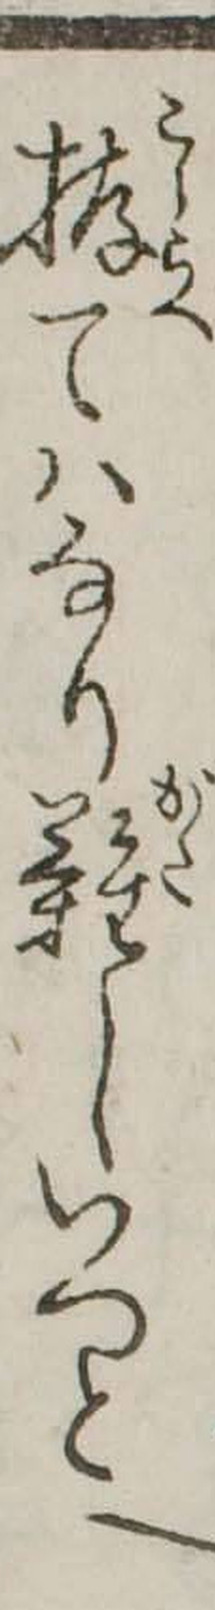拵てはなり難しいつと
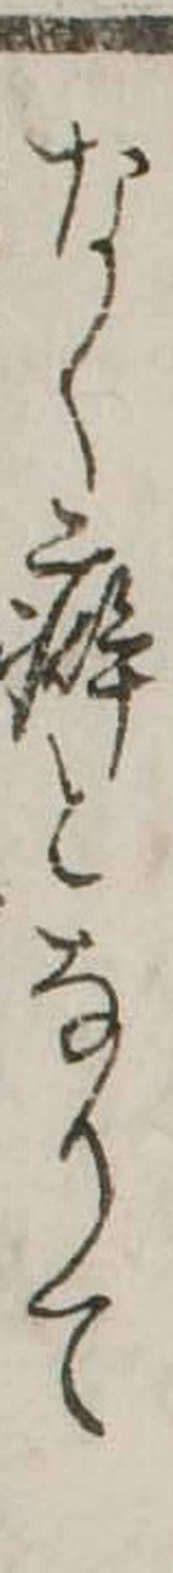なく癖となりて
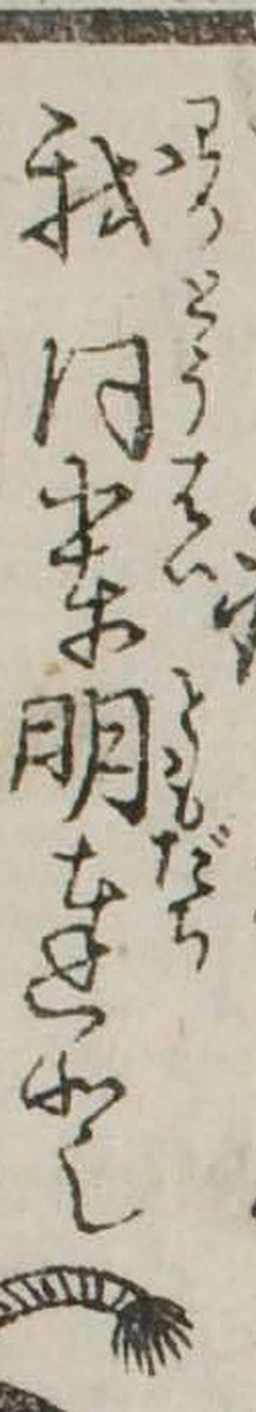我同輩朋達と
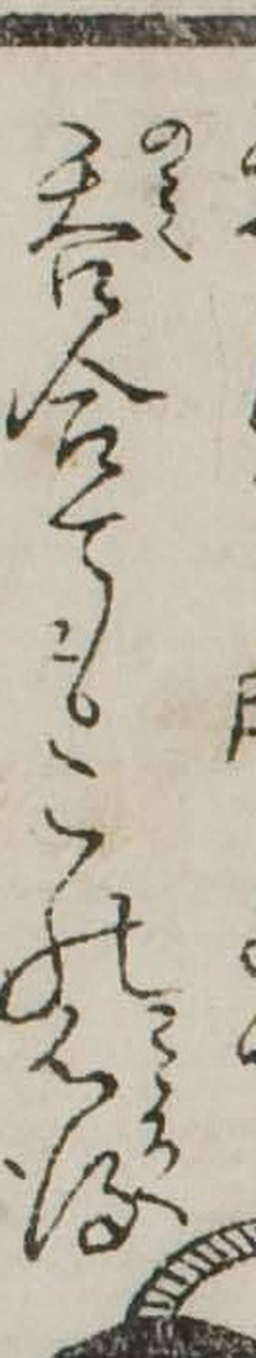呑合てもこの心得
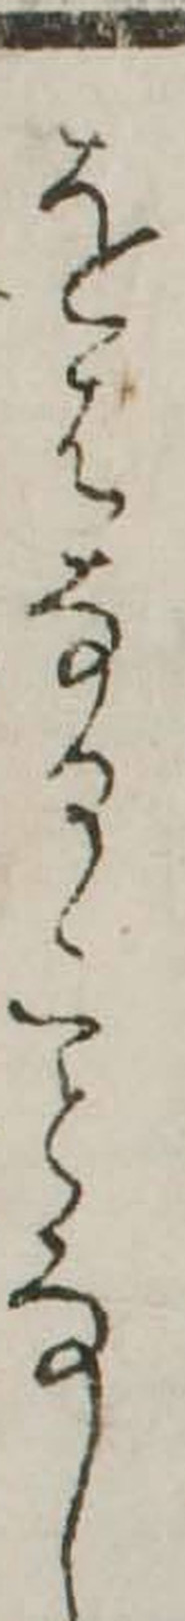をはなるゝことなし
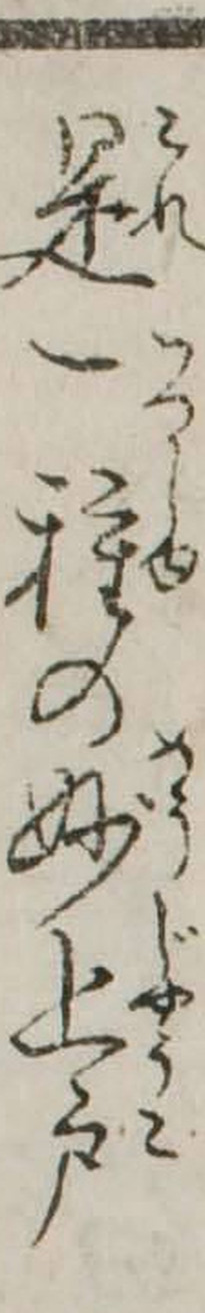是一種の妙上戸
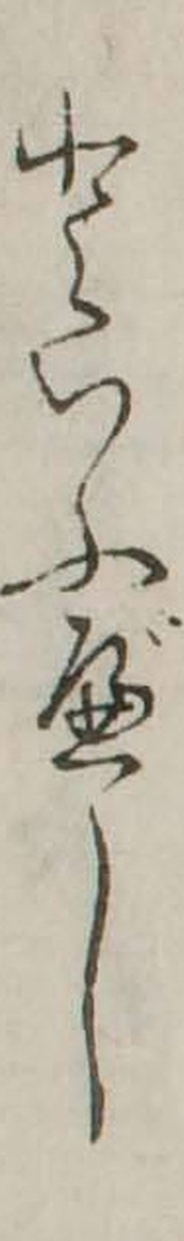といふべし

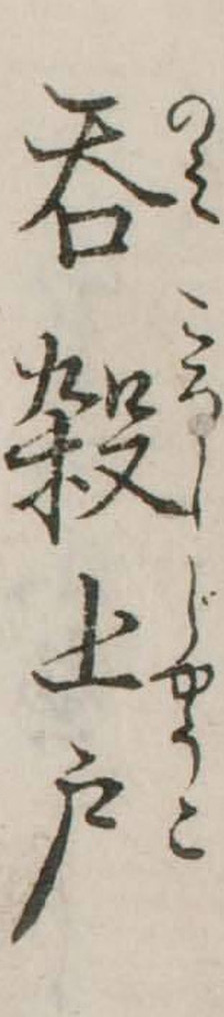呑殺上戸
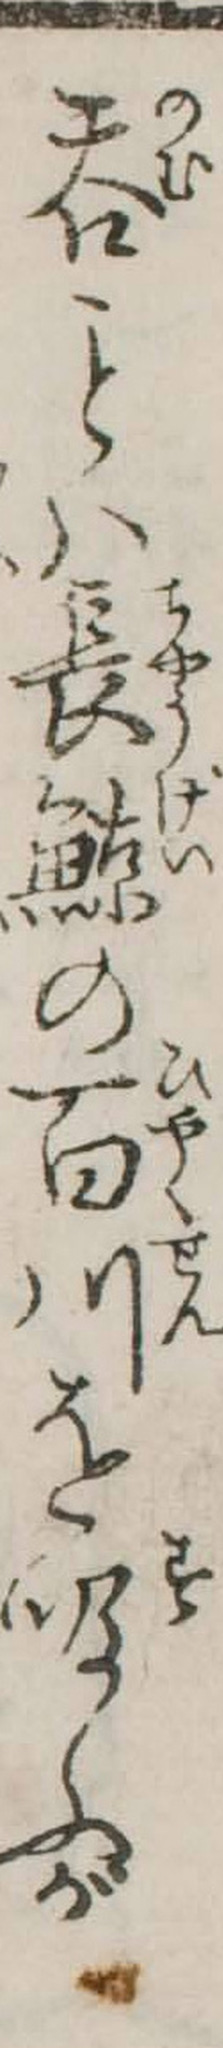呑ことは長鯨の百川を吸ふが
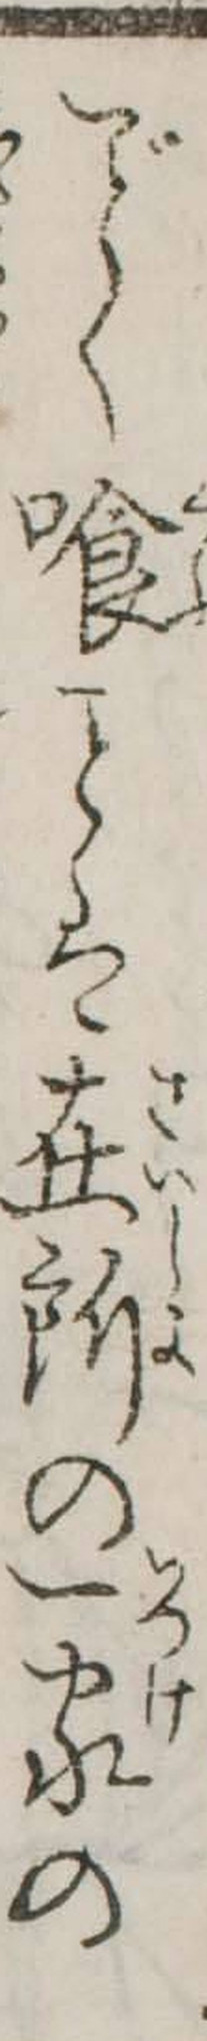ごとく喰ことは在所の一家の
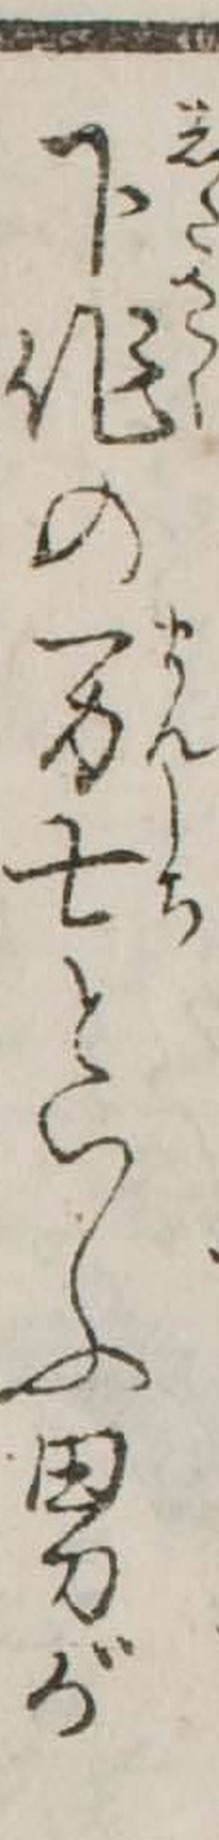下作の万七といふ男が
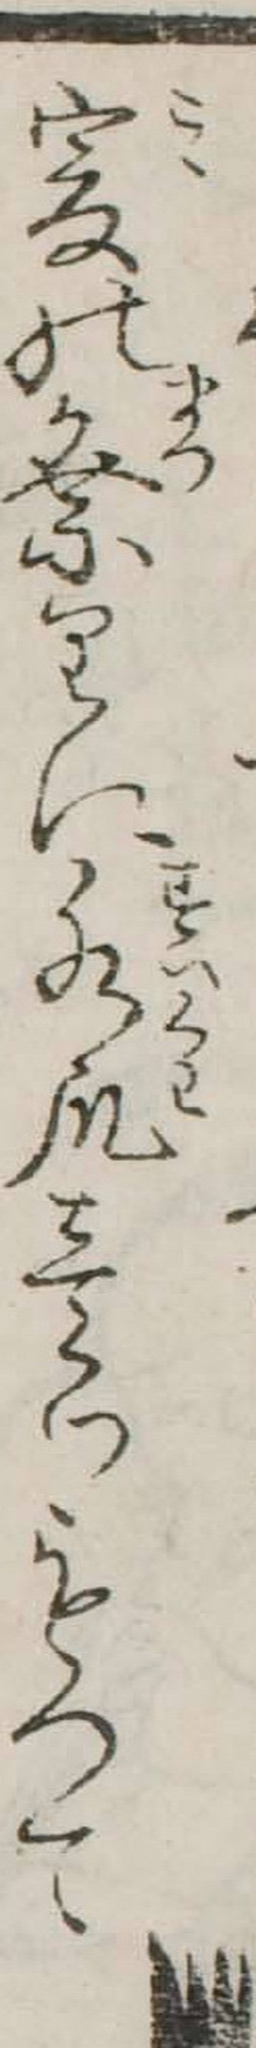爰の祭りに水瓜壱ツもつて
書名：繪本不盡泉
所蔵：国文学研究資料館
